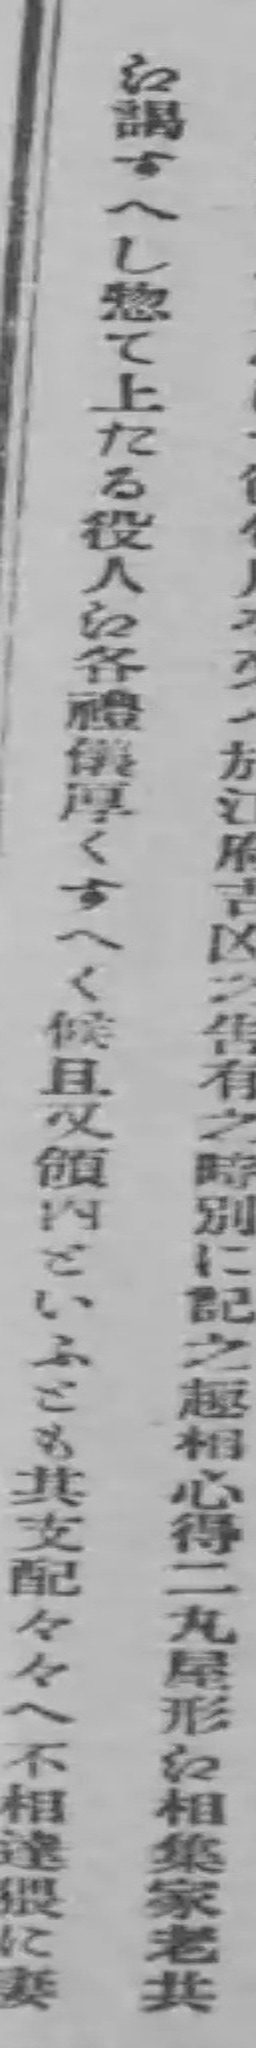え謁すへし惣て上たる役人え各礼儀厚くすへく候且又領内といふとも其支配々々へ不相達猥に妻
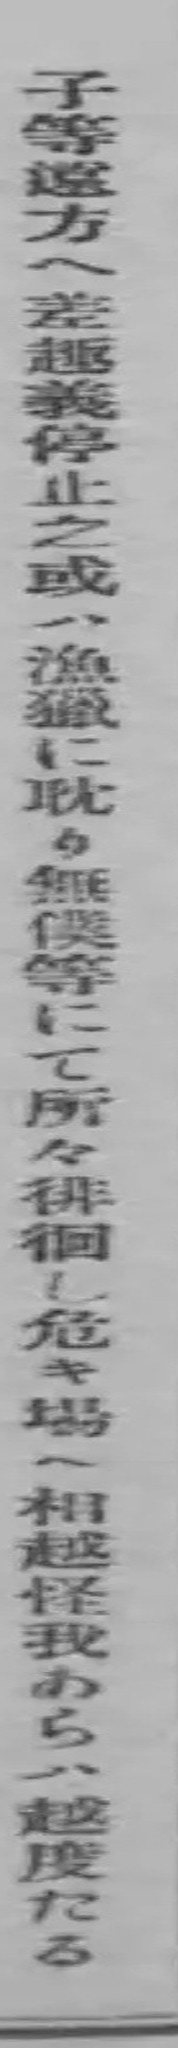子等遠方へ差趣義停止之或は漁猟に耽り無僕等にて所々徘徊し危キ場へ相越怪我あらは越度たる
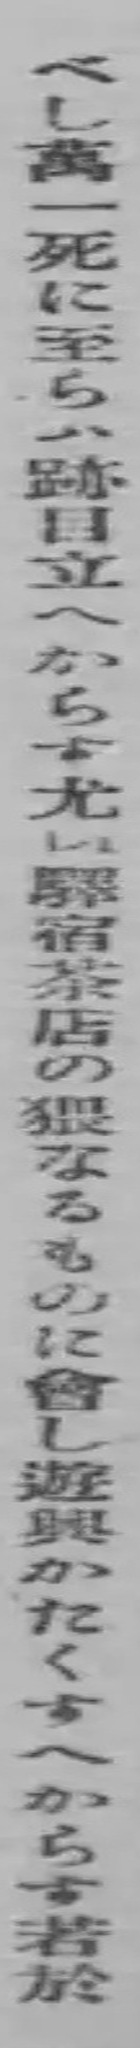べし万一死に至らは跡目立へからす尤駅宿茶店の猥なるものに会し遊興かたくすへからす若於
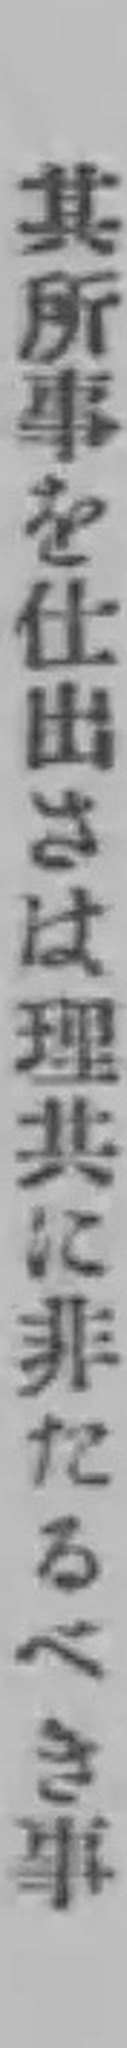其所事を仕出さは理共に非たるべき事
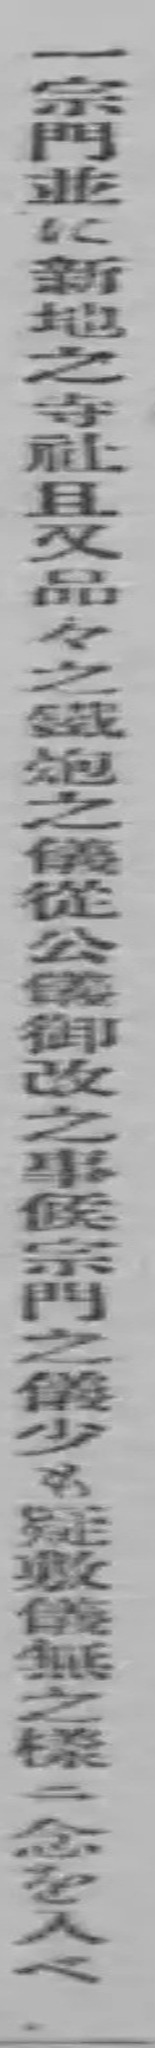一宗門並に新地之寺社且又品々之鉄炮之儀従公儀御改之事候宗門之儀少も疑敷儀無之様ニ念を入べ
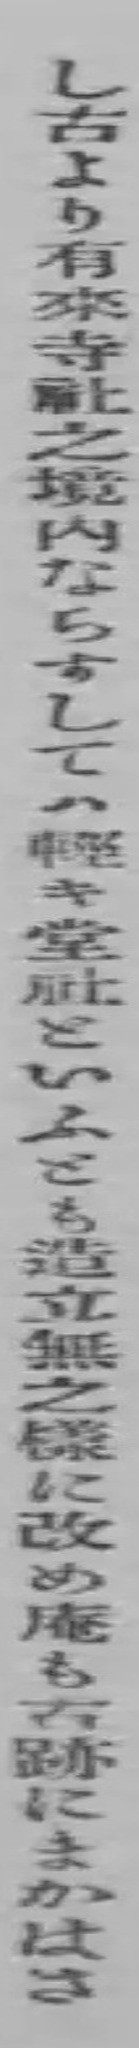し古より有楽寺社之境内ならすしては軽キ堂社といふとも造立無之様に改め庵も古跡にまかはさ
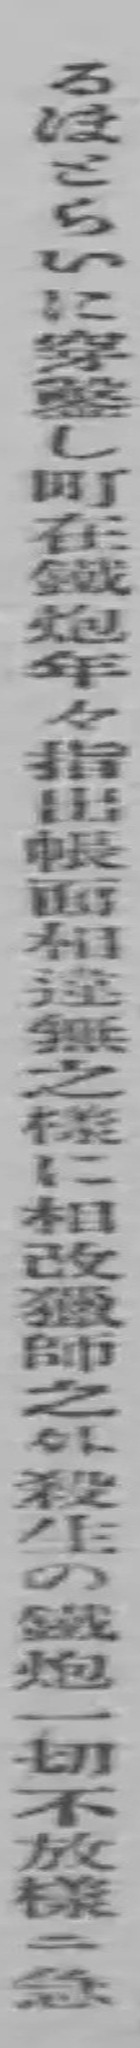るほとらいに穿鑿し町在鉄炮年々指出帳面相違無之様に相改猟師之外殺生の鉄炮一切不放様ニ急
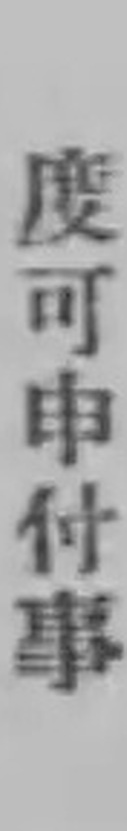度可申付事
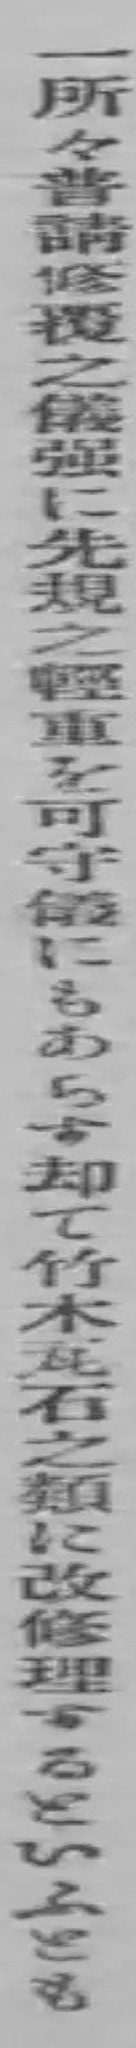一所々普請修覆之儀強に先規之軽重を可守儀にもあらす却て竹木瓦石之類に改修理するといふとも
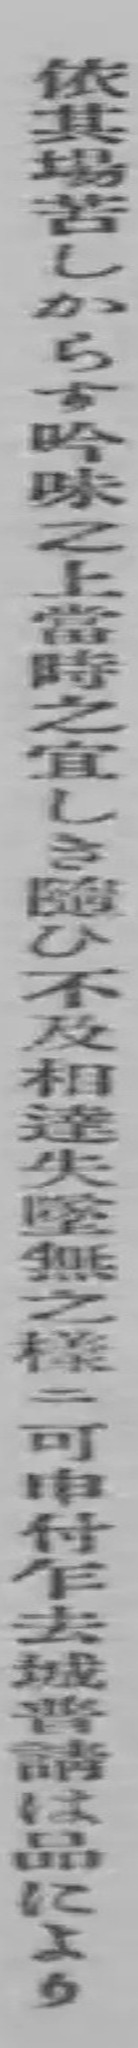依其場苦しからす吟味之上当時之宜しき随ひ不及相達失墜無之様ニ可申付乍去城普請は品により
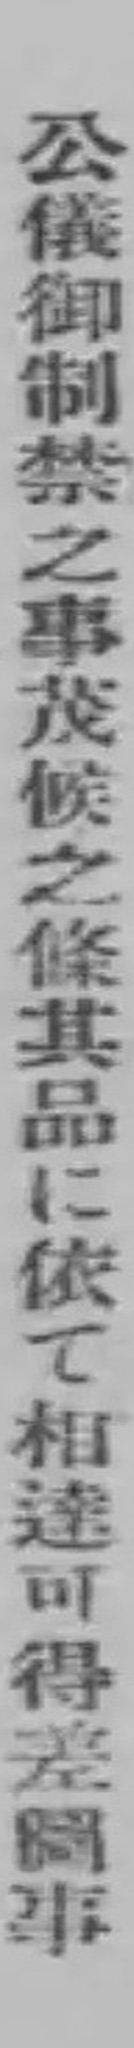公儀御制禁之事茂候之条其品に依て相達可得差図事
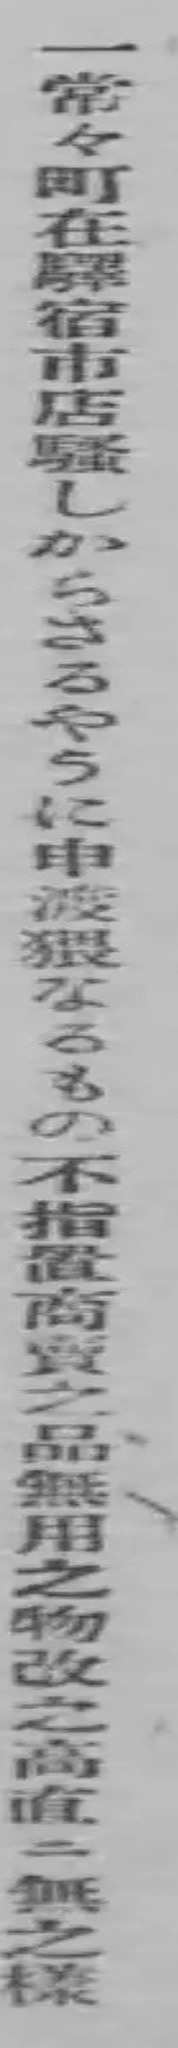一常々町在駅宿市店騒しからさるやうに申渡猥なるもの不指置商売之品無用之物改之高直ニ無之様
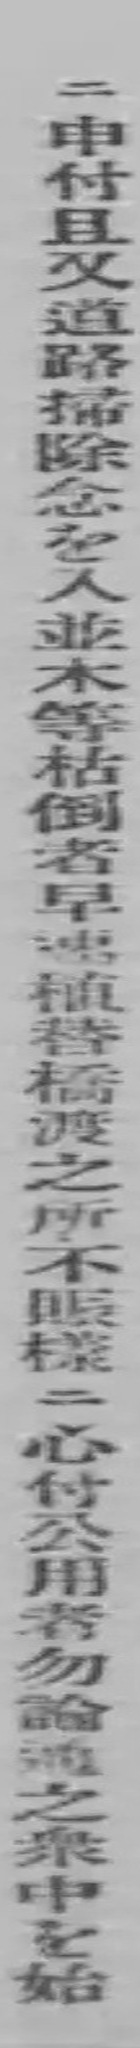ニ申付且又道路掃除念を入並木等枯倒者早速植替橋渡之所不賑様ニ心付公用者勿論通之衆中を始
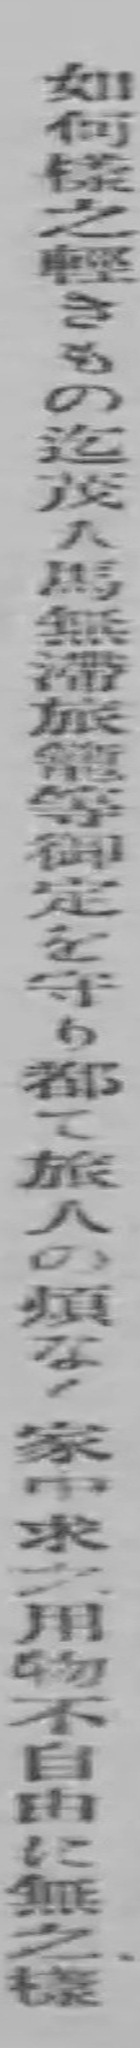如何様之軽きもの迄茂人馬無滞旅籠等御定を守り都て旅人の煩なく家中求之用物不自由に無之様
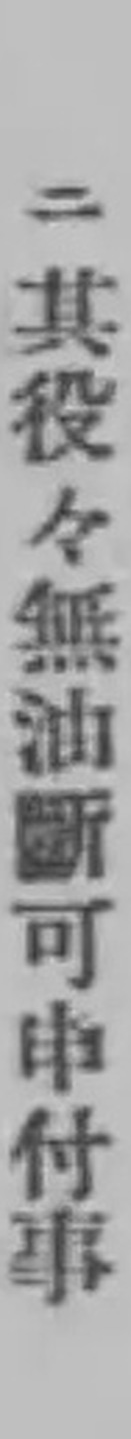ニ其役々無油断可申付事
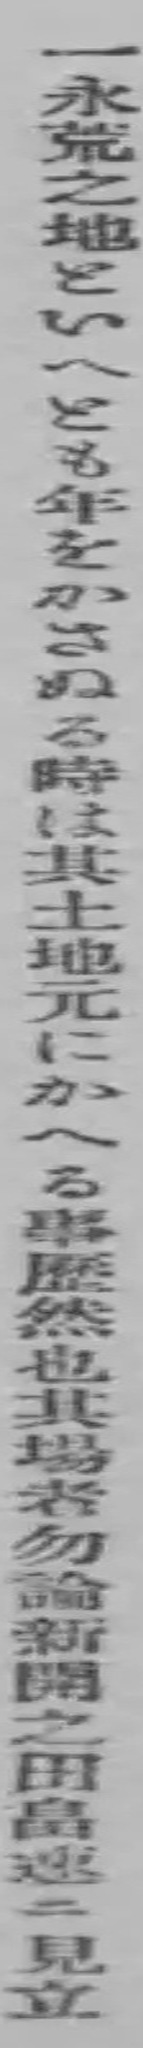一永荒之地といへとも年をかさぬる時は其土地元にかへる事歴然也其場者勿論新開之田畠速ニ見立
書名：豊橋市史談
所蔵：国立国会図書館 National Diet Library, JAPAN
